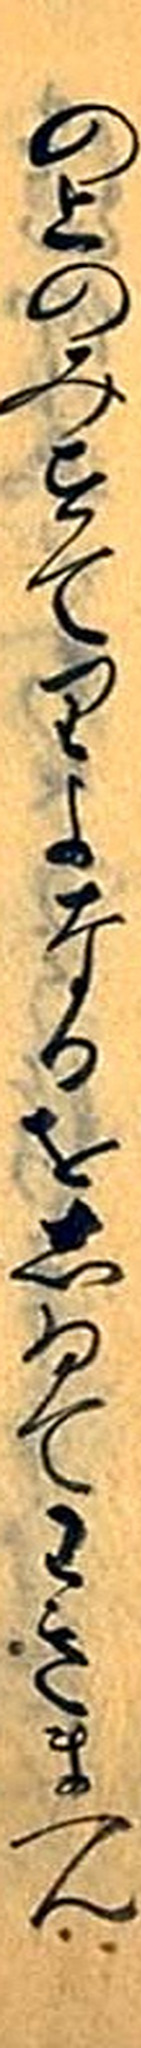の上のみすてりよなるをしゐてわきまへん
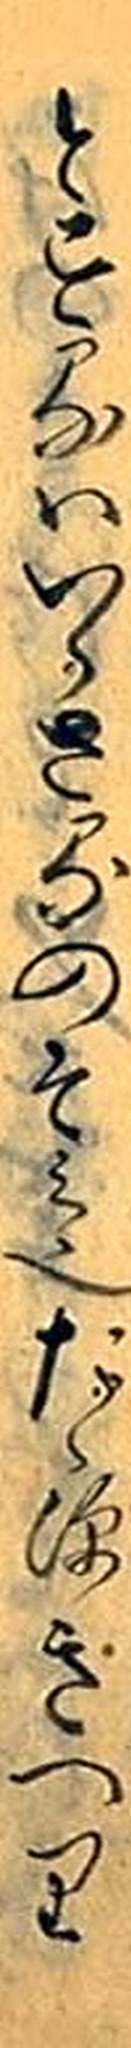とするはいらさるのそみ也たゝ深きへり
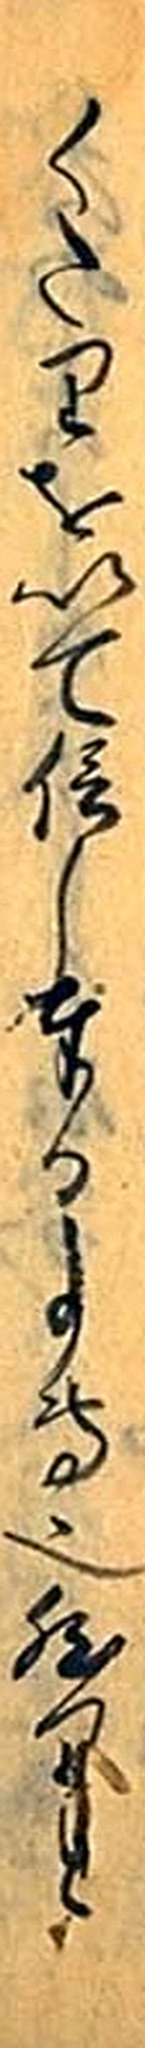くたりを以て信し奉る事専也然りと
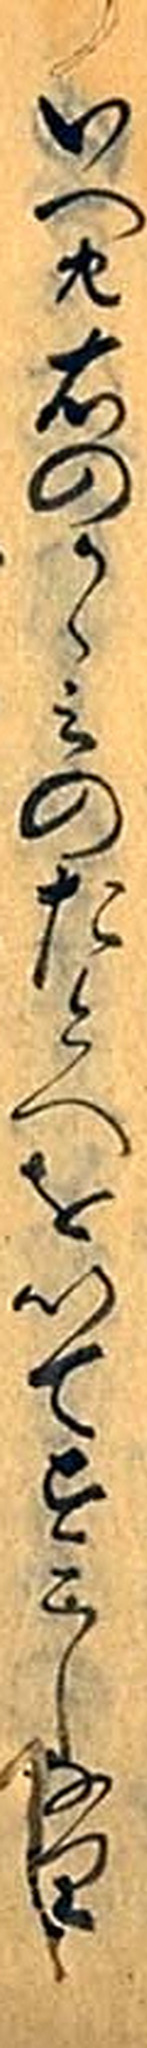いへ共右のかゝみのたとへを以てすこしなり
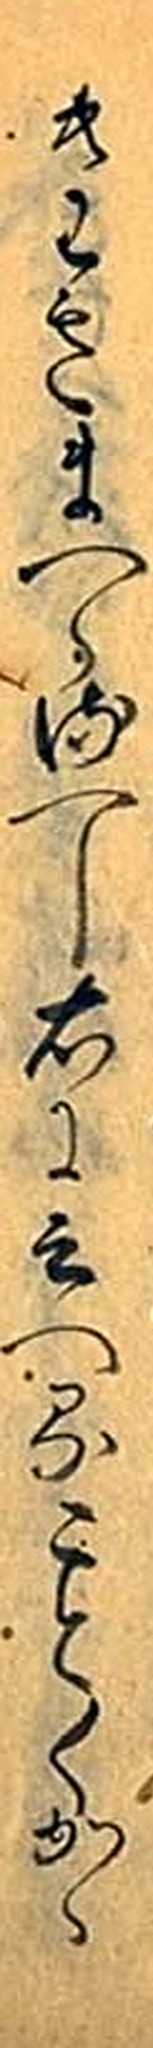共わきまへらるへし右に云へることくかゝ
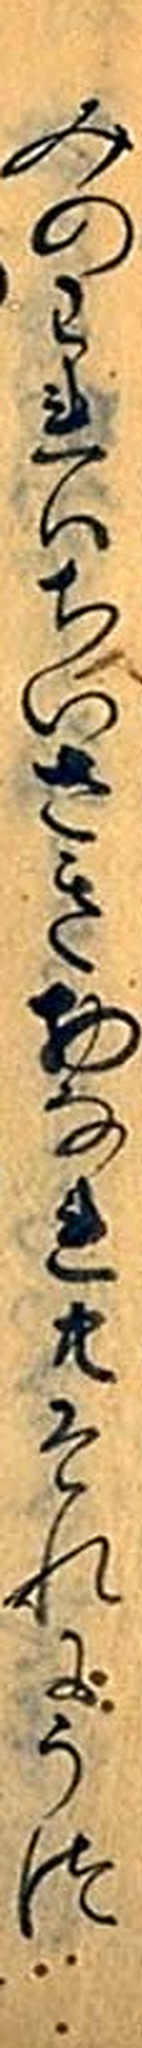みのわれはちいさき物なれ共それにうつ
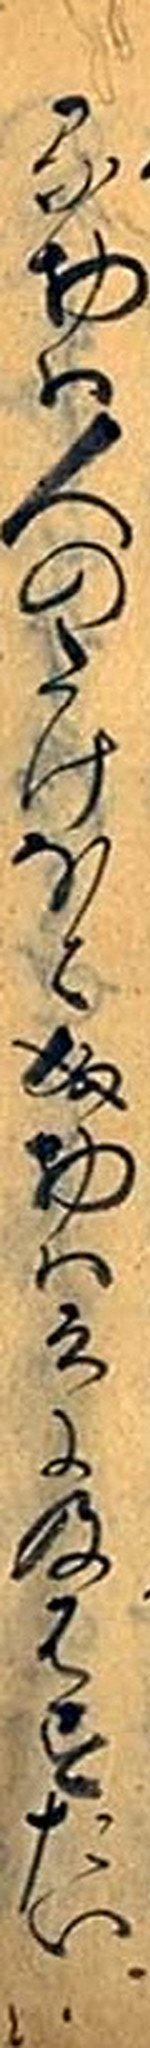る物は人のたけほと成物は云に及はすたい
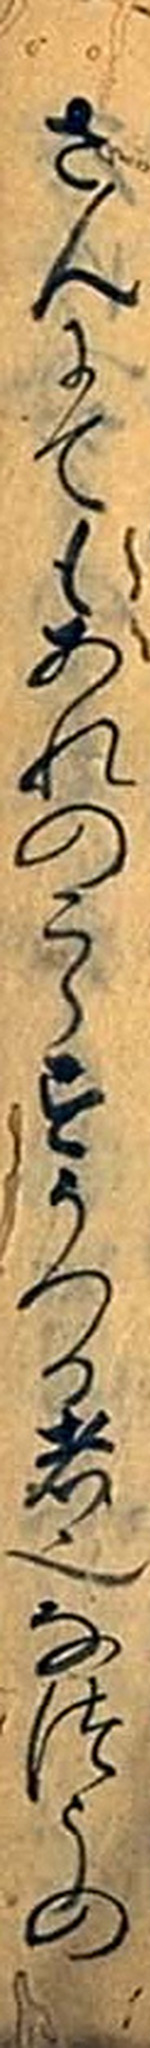さんにてもあれのこらすうつる者也なつうの

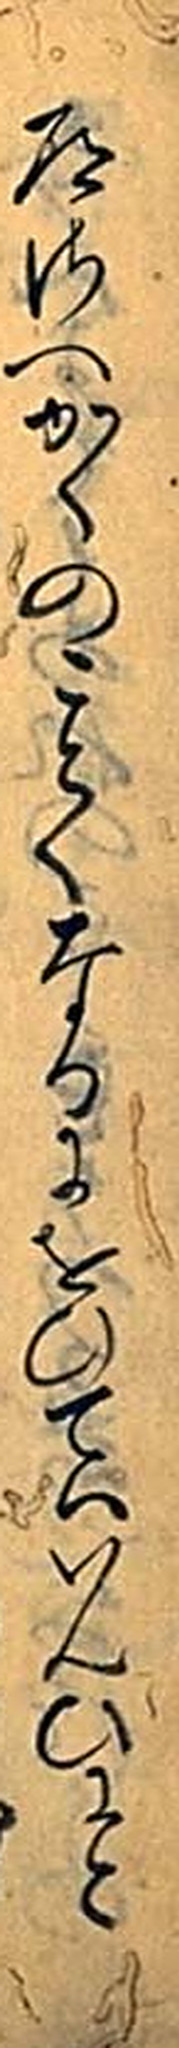道さへかくのことくなるにをひてはいんひにと
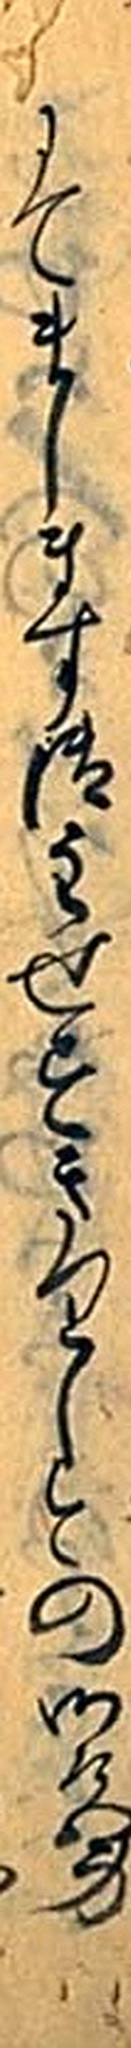にてまします御主せすきりしとの御色身
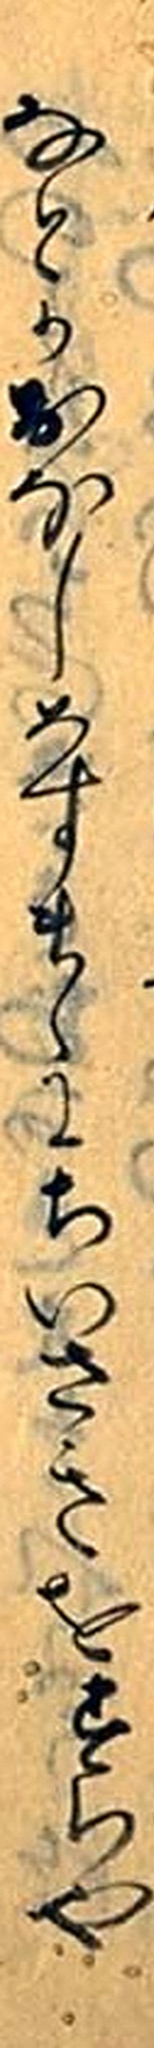なとかおほしめすまゝにちいさきをすちや
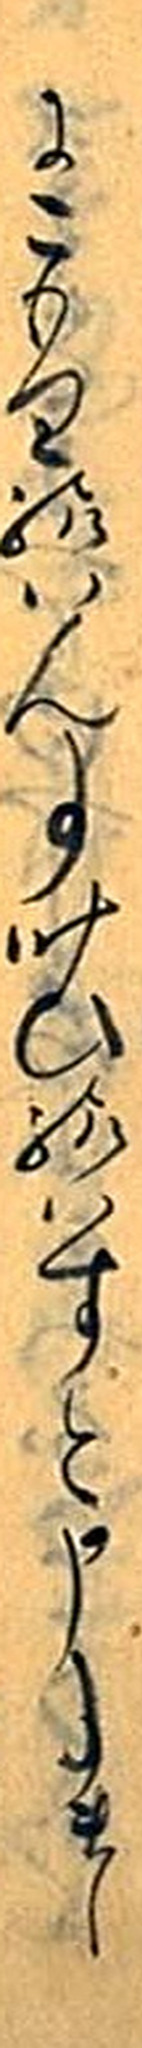にこもり給はん事叶ひ給はすと申事まし
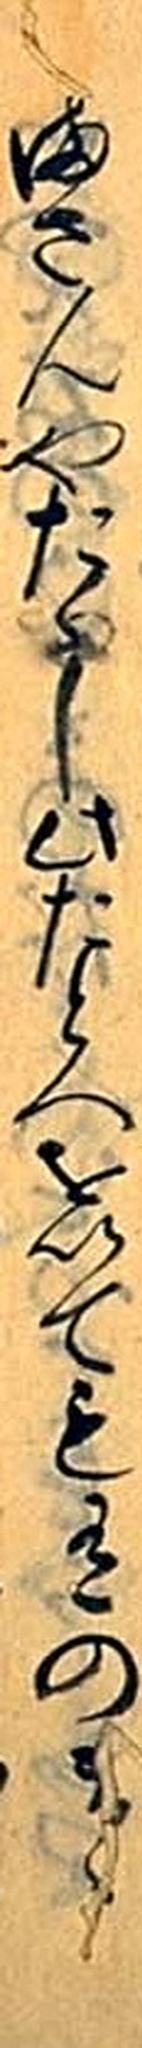まさんやたゝし此たとへを以ても有のまゝ
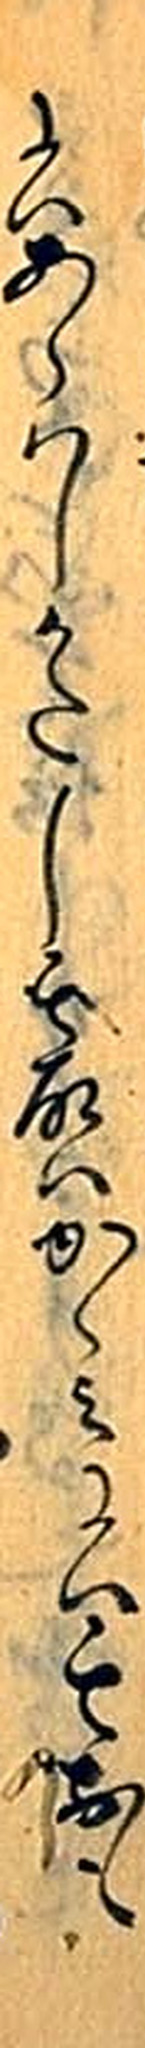にはあらはしかたし其故はかゝみには其おも
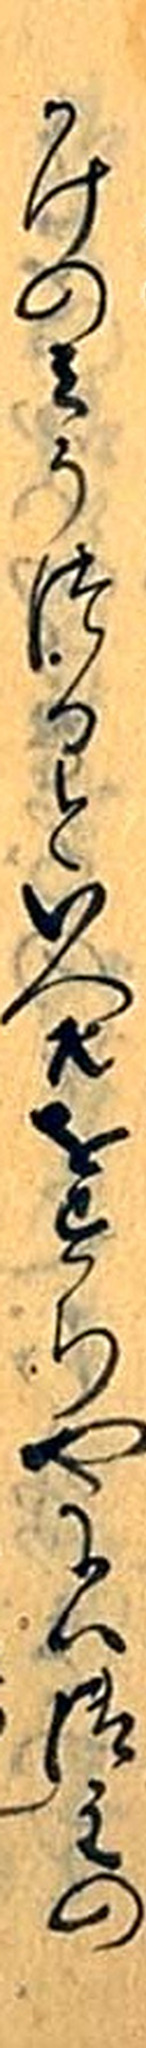かけのみうつるといへ共をすちやには御主の
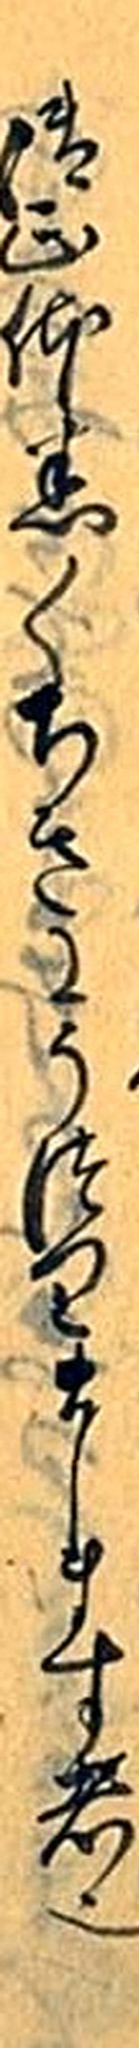御正体悉くちきにうつりまします者也
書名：ドチリナ・キリシタン
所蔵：東京大学総合図書館 / General Library in the University of Tokyo
